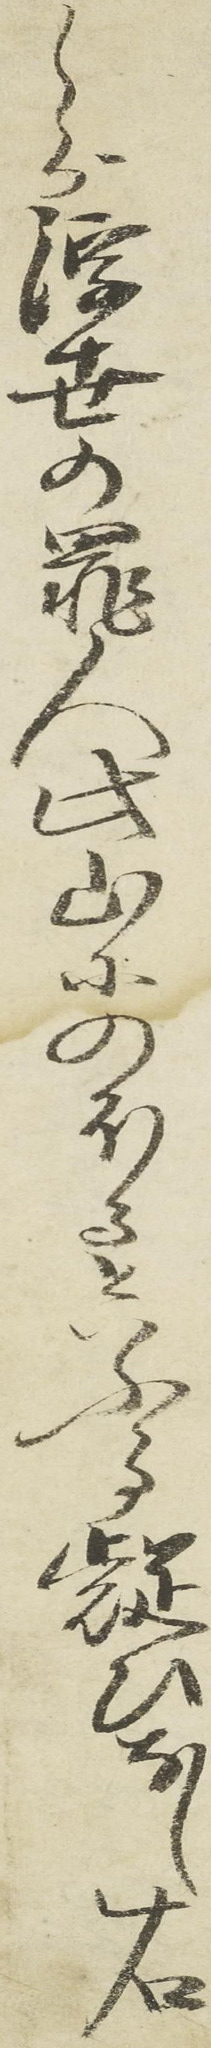しが浮世の罪人此山にのほるといふ事疑ひなし右
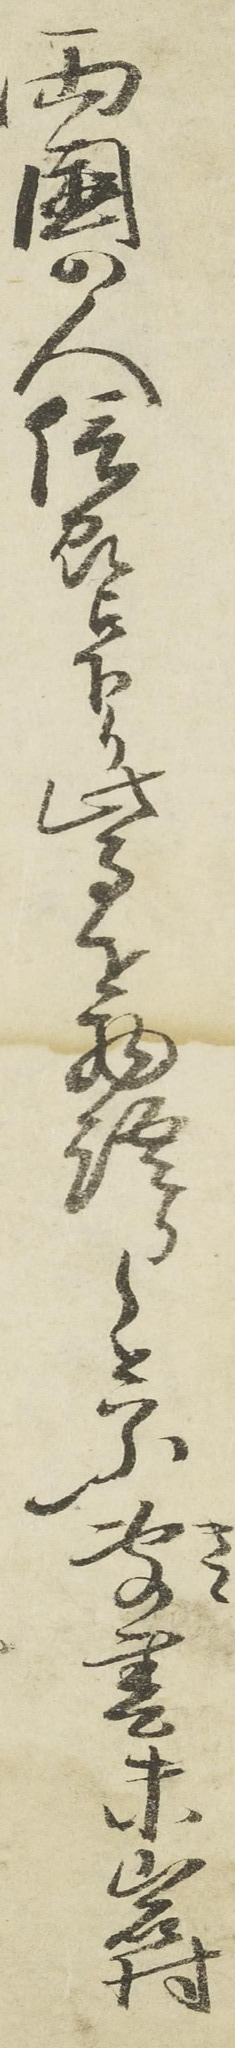両国の人住郷江下り此事を物語りしといふ聞書未岩村
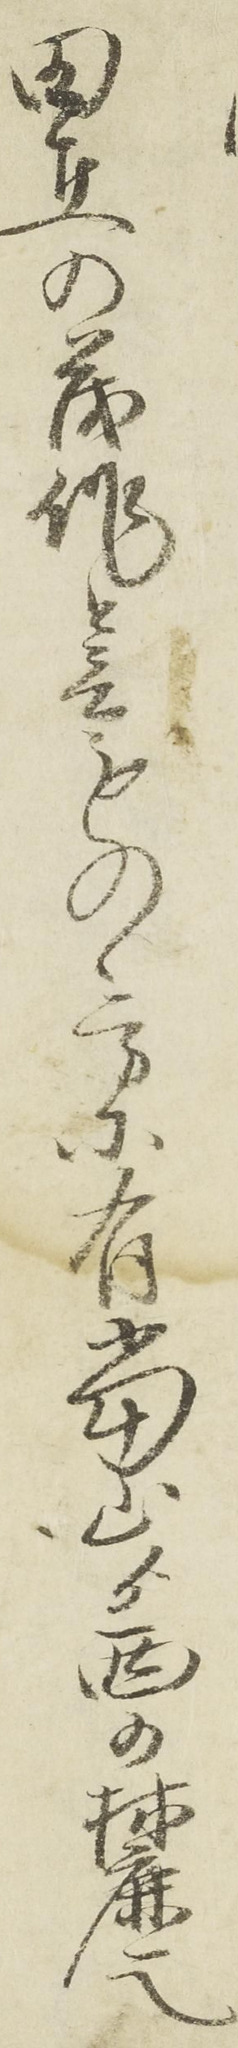田在の茂作と言うもの方に有当山ゟ西の麓也
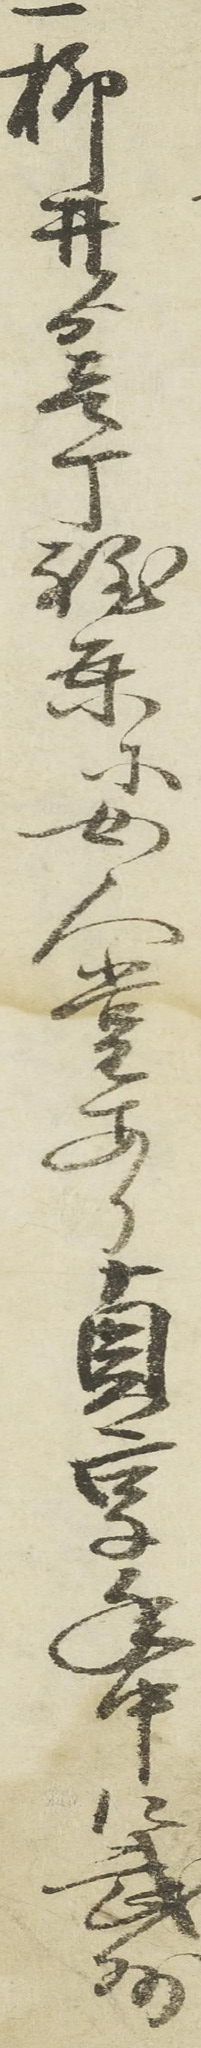一柳井ゟ壱丁程東に女人堂あり貞享年中に武州
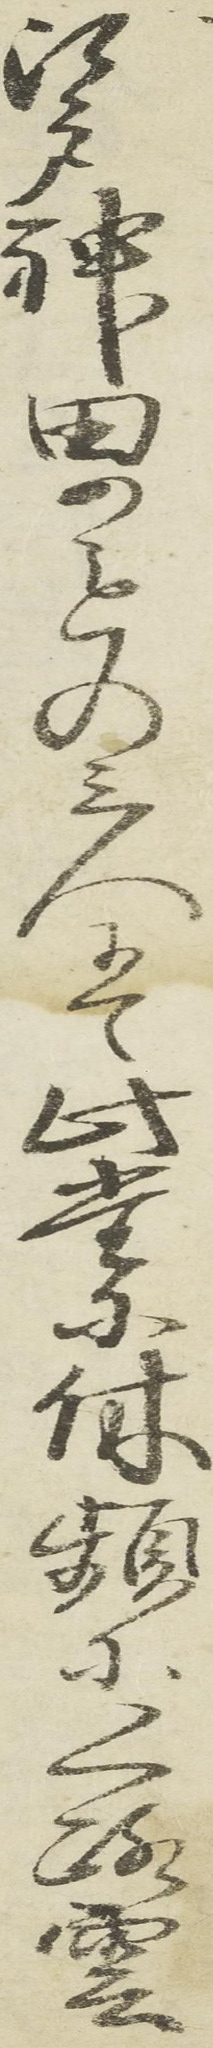江戸神田のもの三人にて此堂に休頻にくろ雲
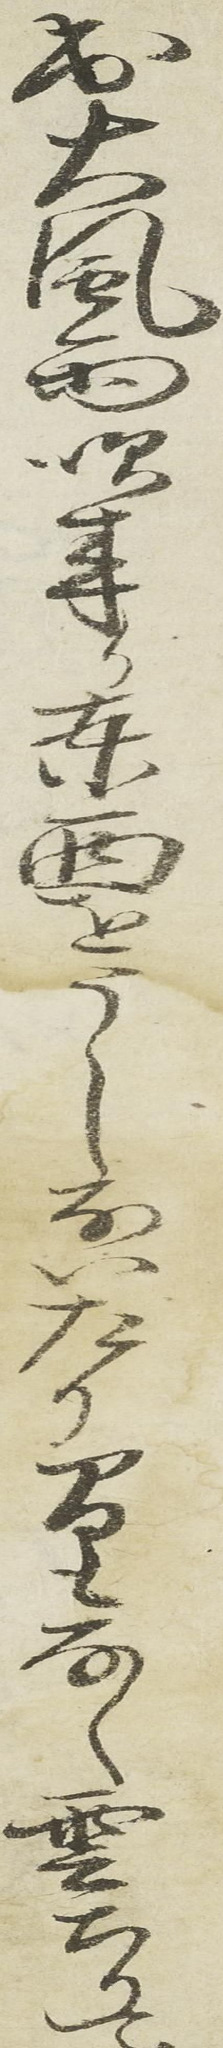出大風雨吹来り東西をうしないたり間もなく雲ちりて
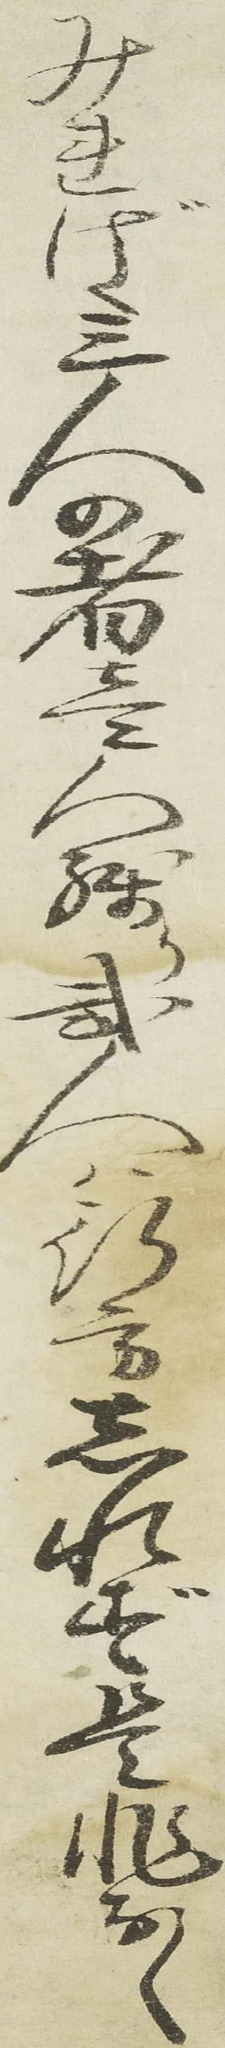みれば三人の者壱人残り弐人ハ行方忘れず是非なく
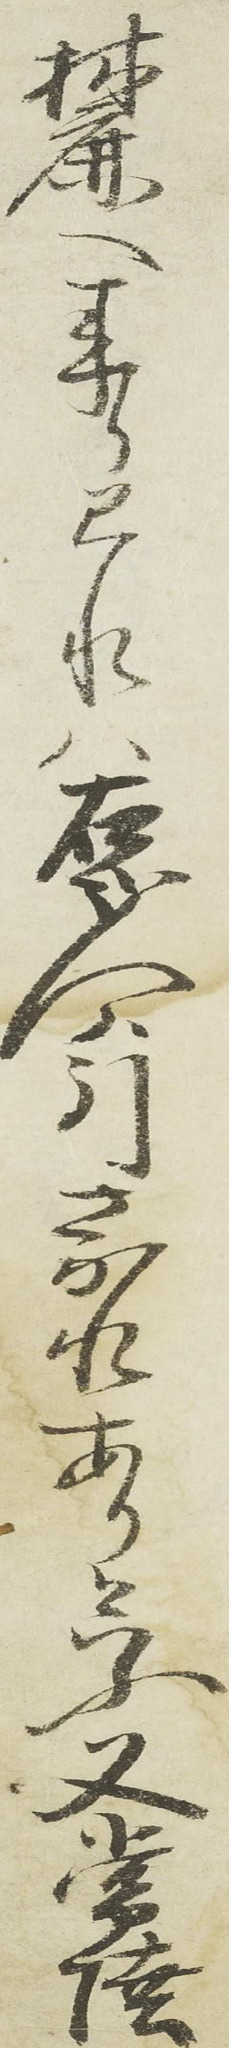麓へ来りわれハ右弐人ハ引さかれありといふ又常陸
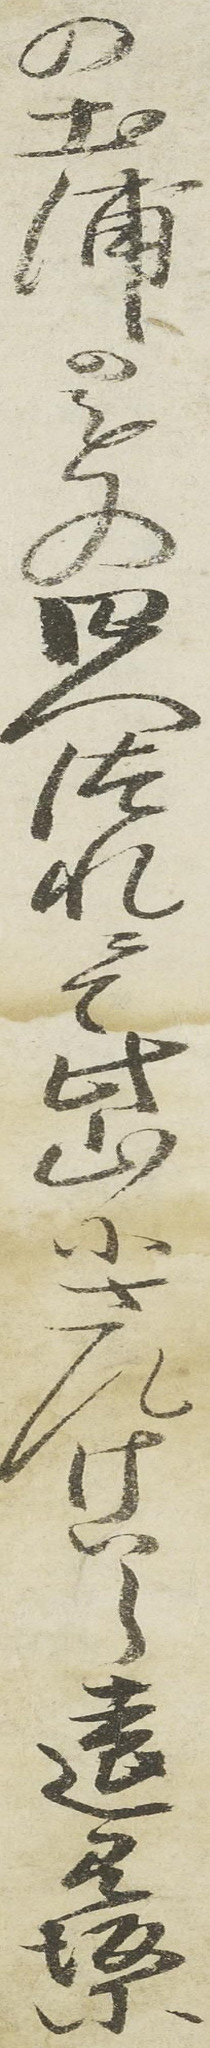の土浦のもの四人つれニて此山にさんけいし遠見坂に
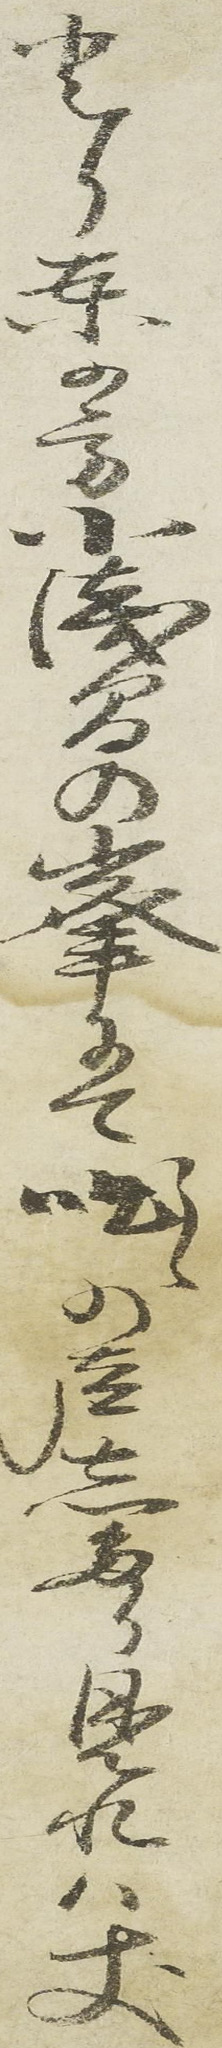登り東の方小浅間の峯にて咄の声したり見れハ丈
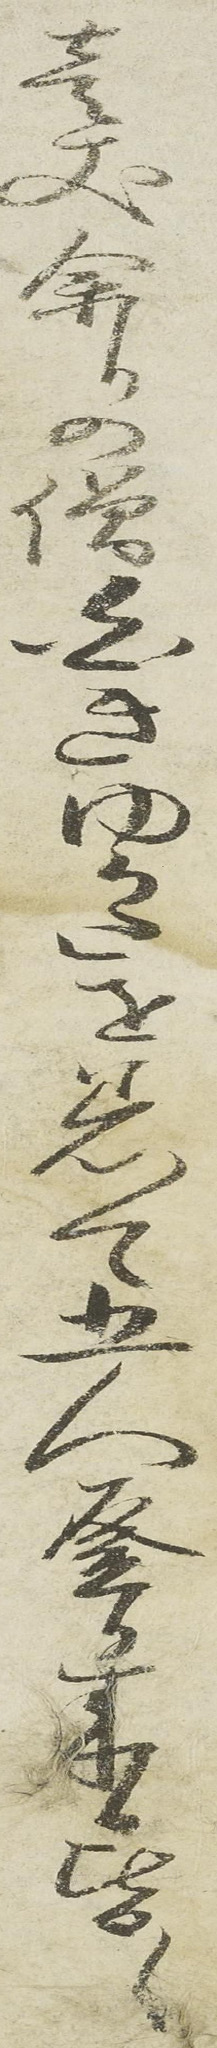壱丈余りの僧白きゆかたを着て五人登り来る皆〳〵
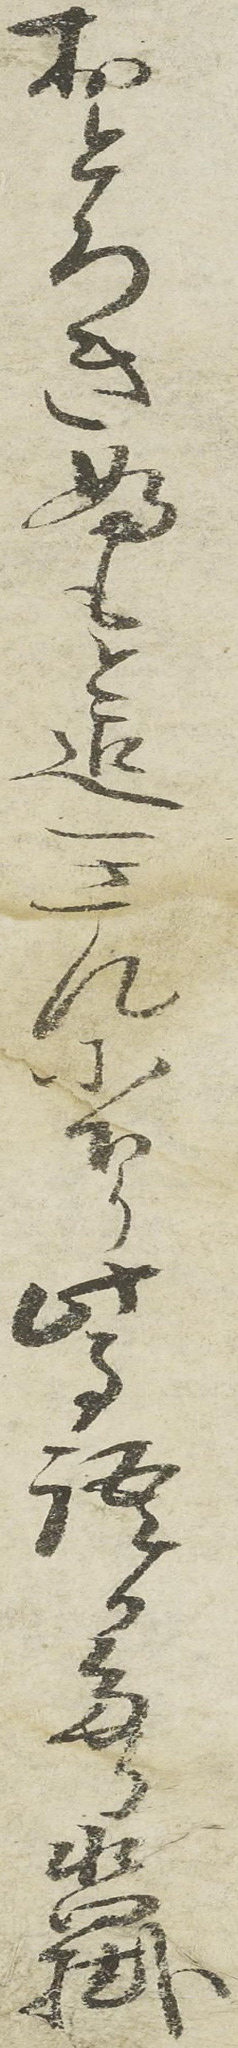おとろきふもと迄一さんに下り此事語りたり沓掛
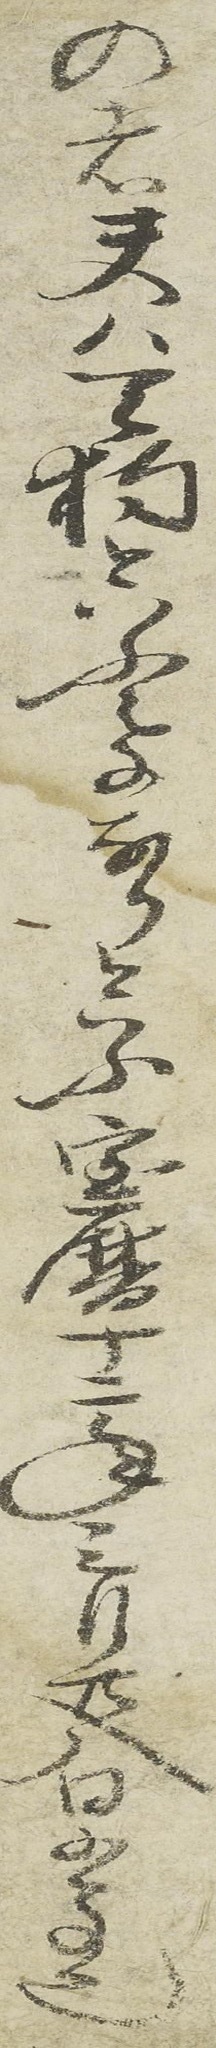の者夫ハ天狗といふものなりといふ宝暦十二年三月廿八日の事也

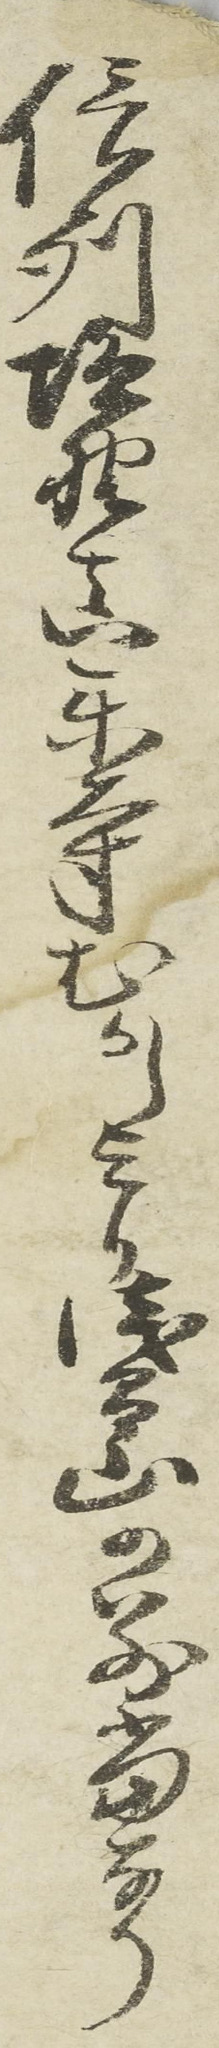一信州堀野真楽寺むかしより浅間山の別当なり
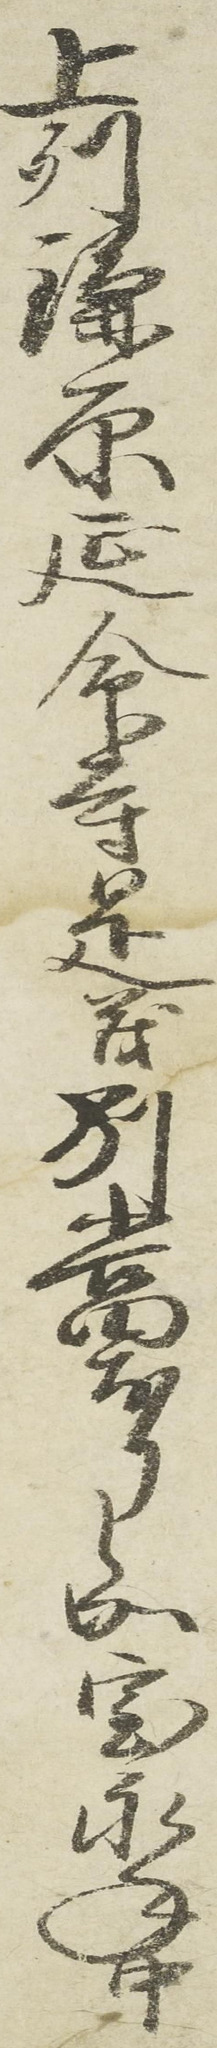一上州鎌原延命寺是も別当なりし処宝永の中
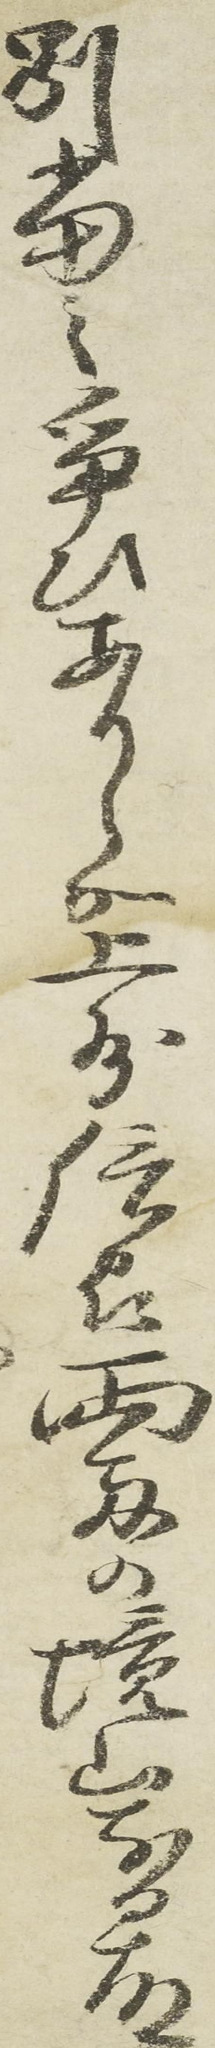別当の争ひありしが上州信州両国の境山なる故
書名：浅間大変略記
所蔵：東京大学地震研究所図書室 Earthquake Research Institute Library, The University of Tokyo, JAPAN
